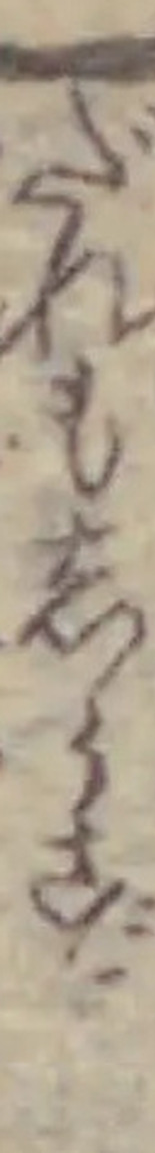だれもしらず
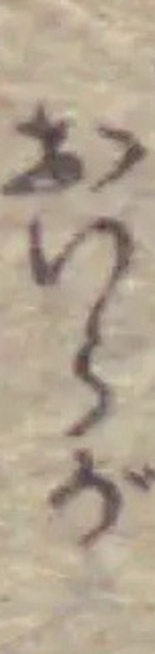おいらが
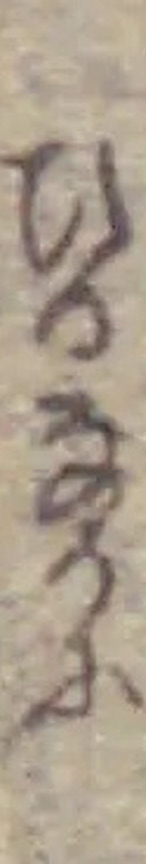ひるなかに
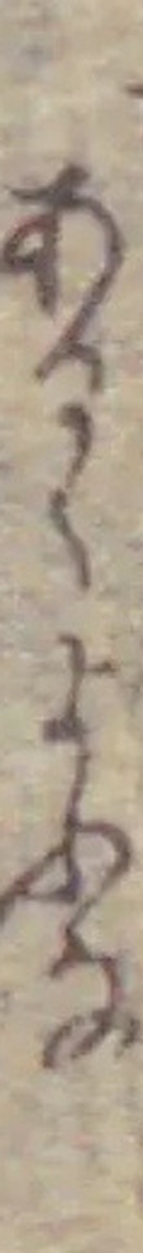あるくよふな
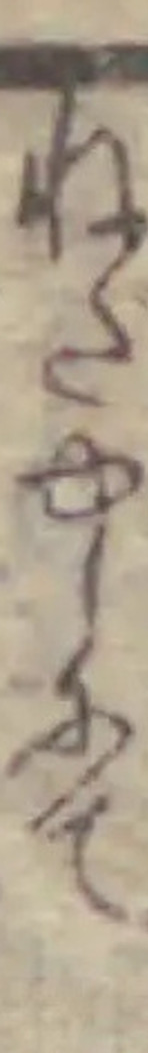ねだやしにて
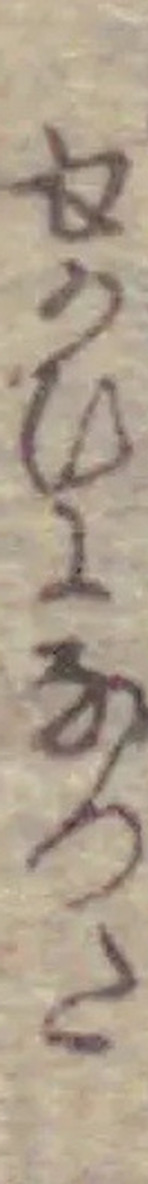せかひになつた
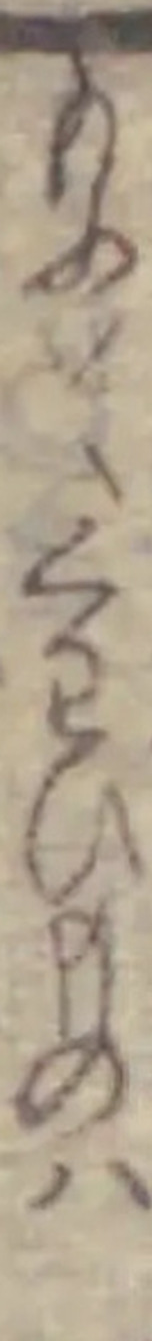もふ〳〵くわひものは
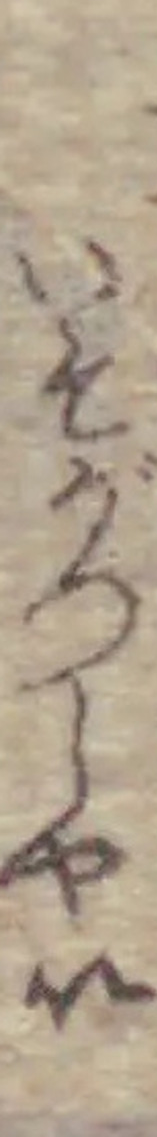いそがつしやれ
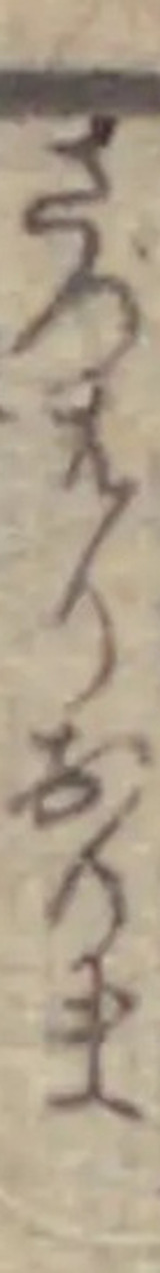さつはりおりま
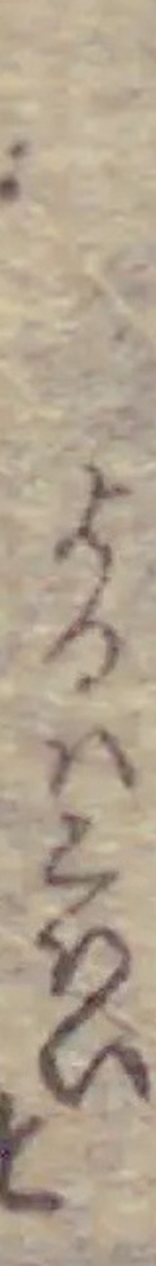よるはこはいそ
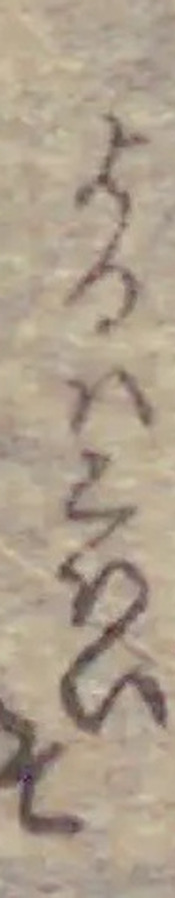よるはこはいそ
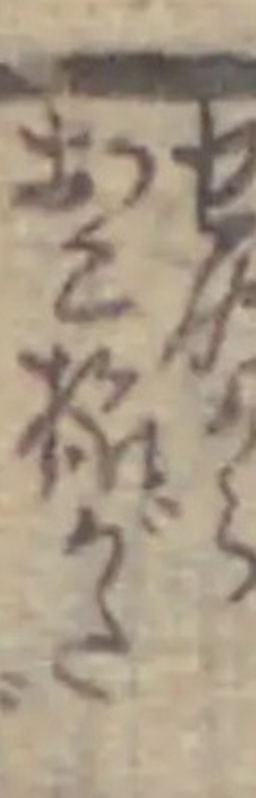おこ様がた
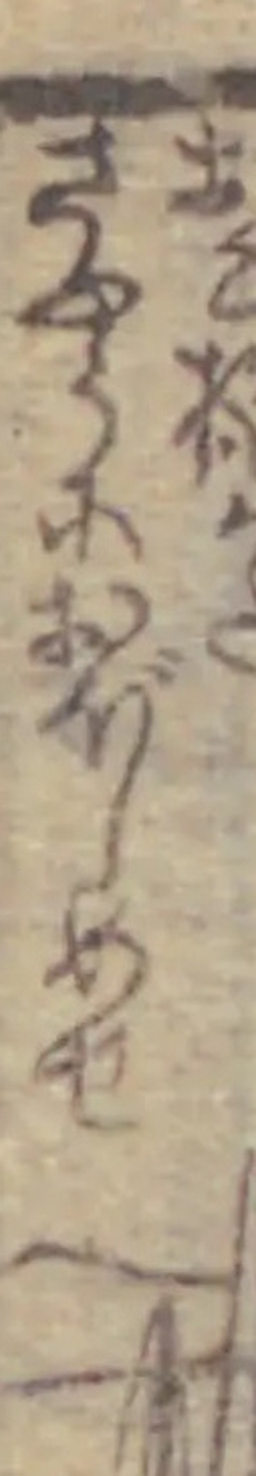さやうにおぼしめせ
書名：化物大閉口 2巻
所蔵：国立国会図書館 National Diet Library, JAPAN
